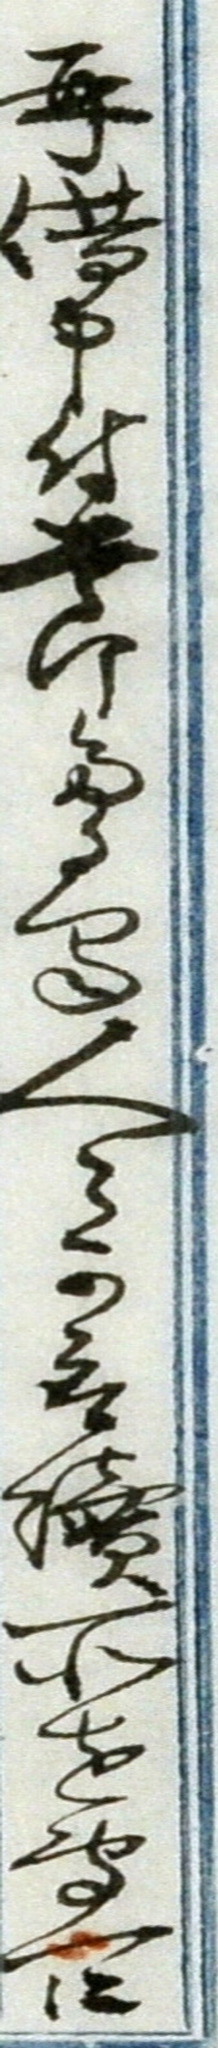再借申付節たる間人々可取続所を専に
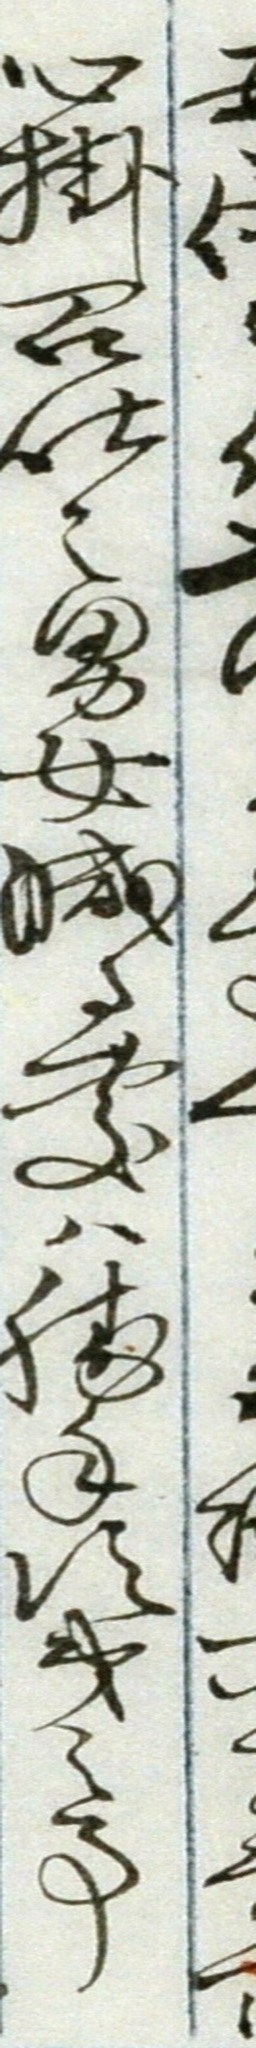心掛召仕之男女減る処ハ勝手次第之事
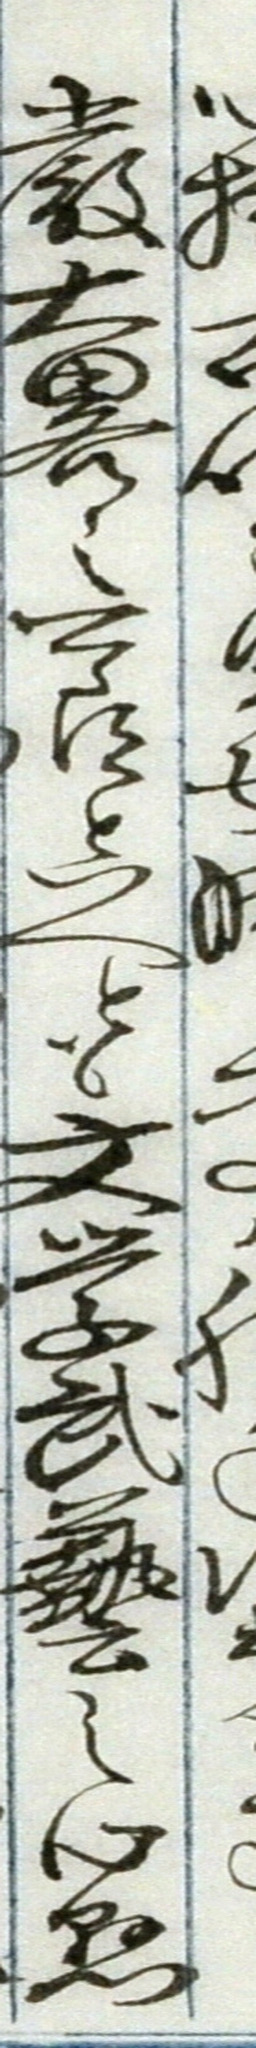一厳大略之節といへとも文学武芸之心懸
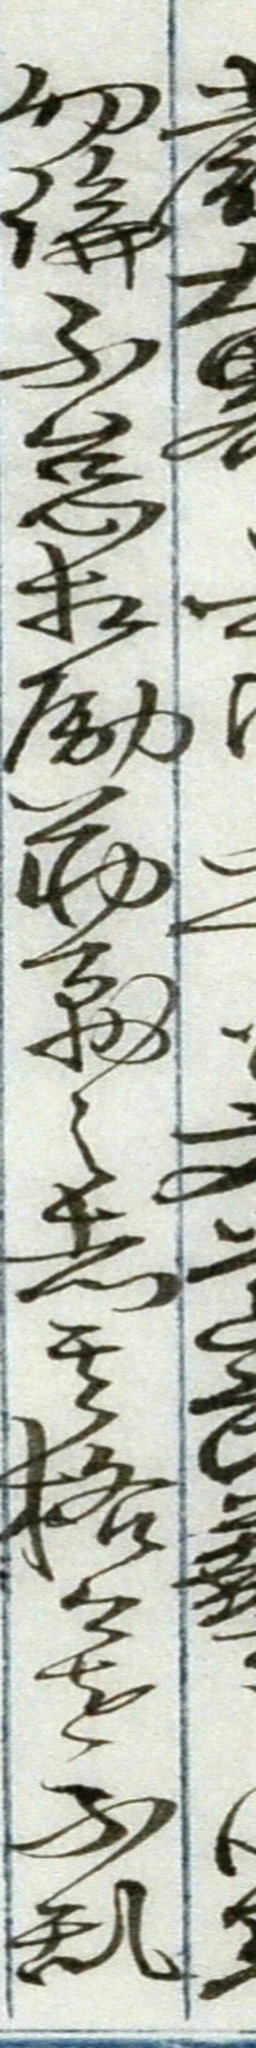勿論不怠相励勤勉之者其格々を不乱
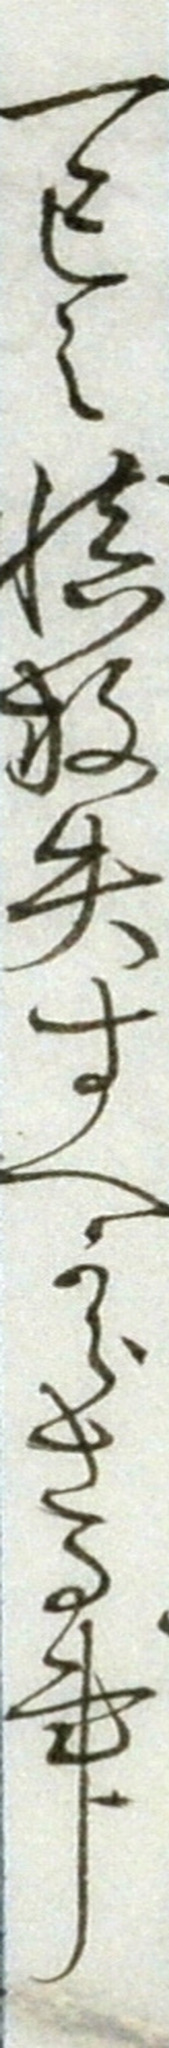一己之慎放失すへからさる事
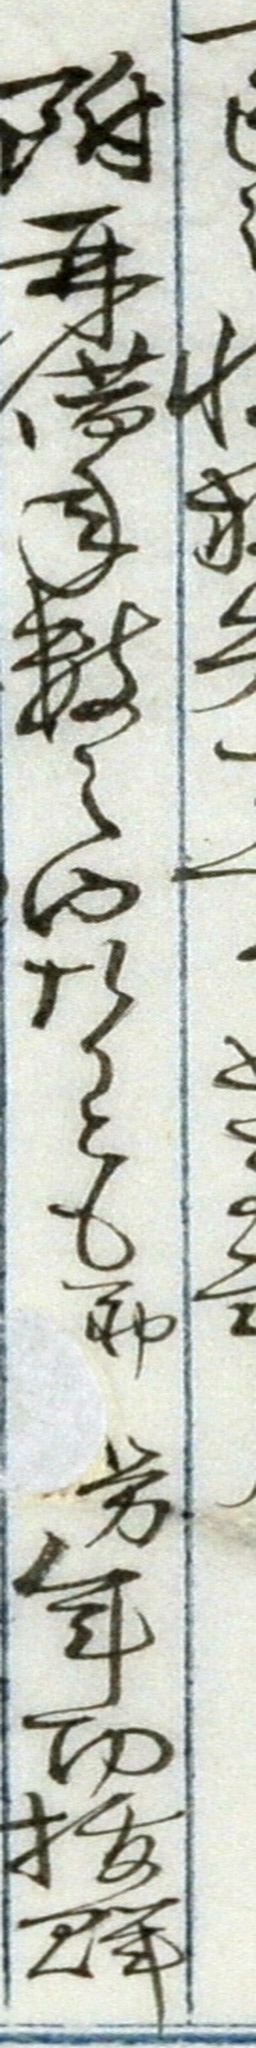附再借年数之内たりとも勤労年功抜群
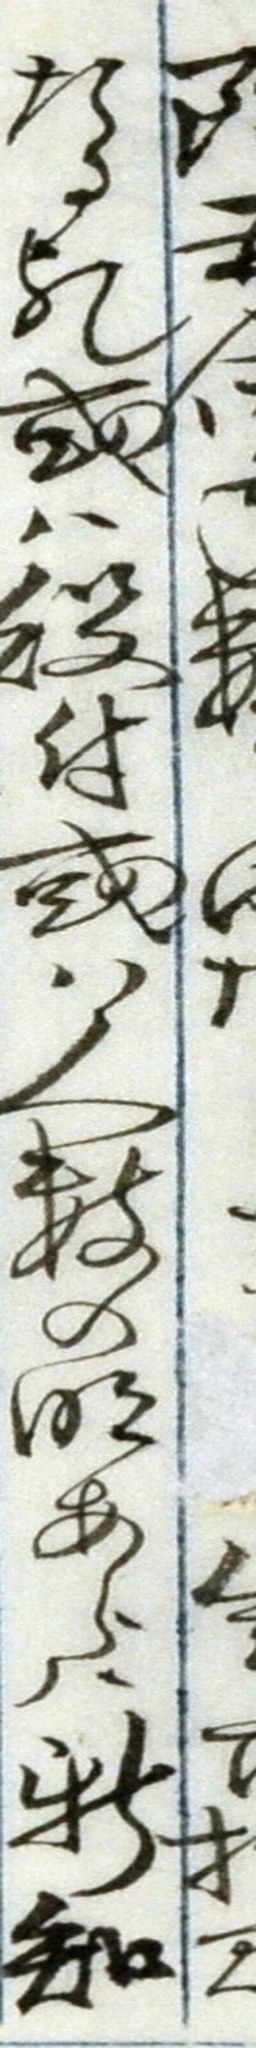たる歟或ハ役付或ハ人数の明あらハ新知
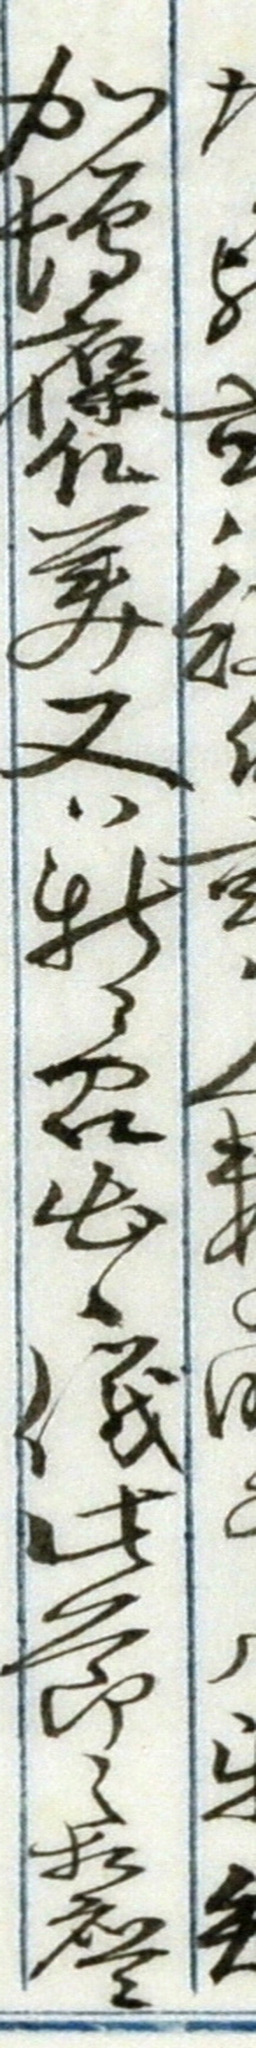加増褒美又ハ新ニ召出候儀此節之相応ニ
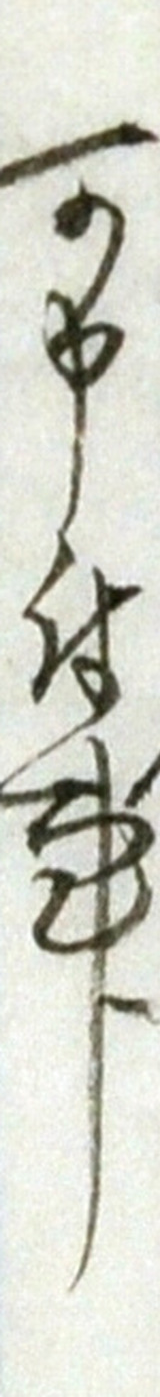可申付事
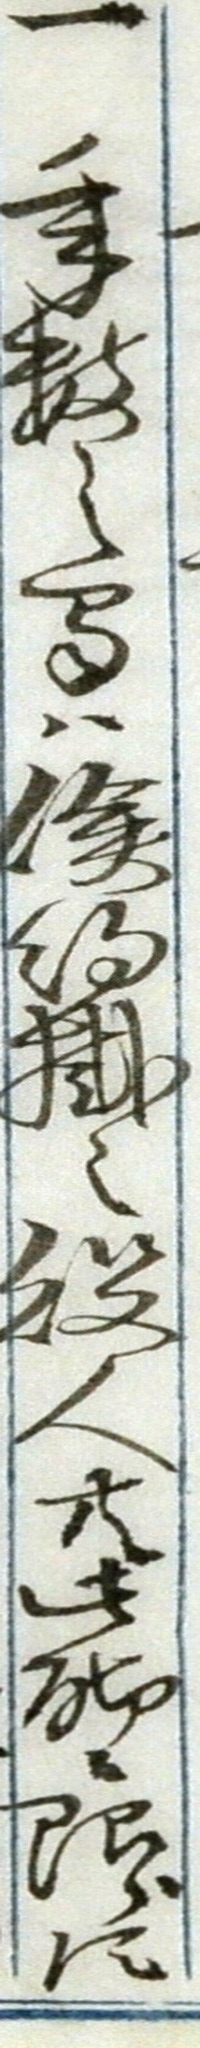一年数之之間ハ倹約掛之役人共此砌ニ限らす
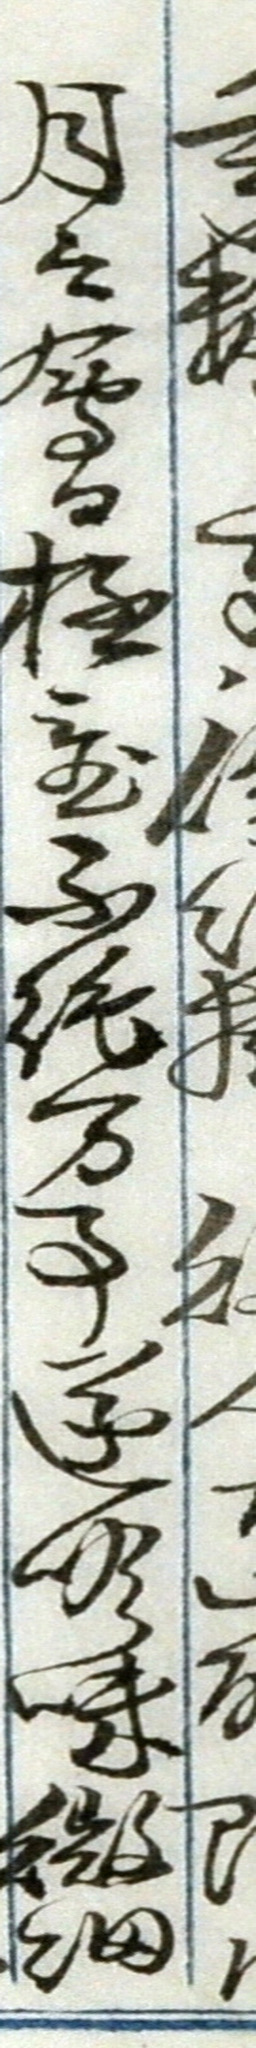月々会日極置不純万事遂吟味微細
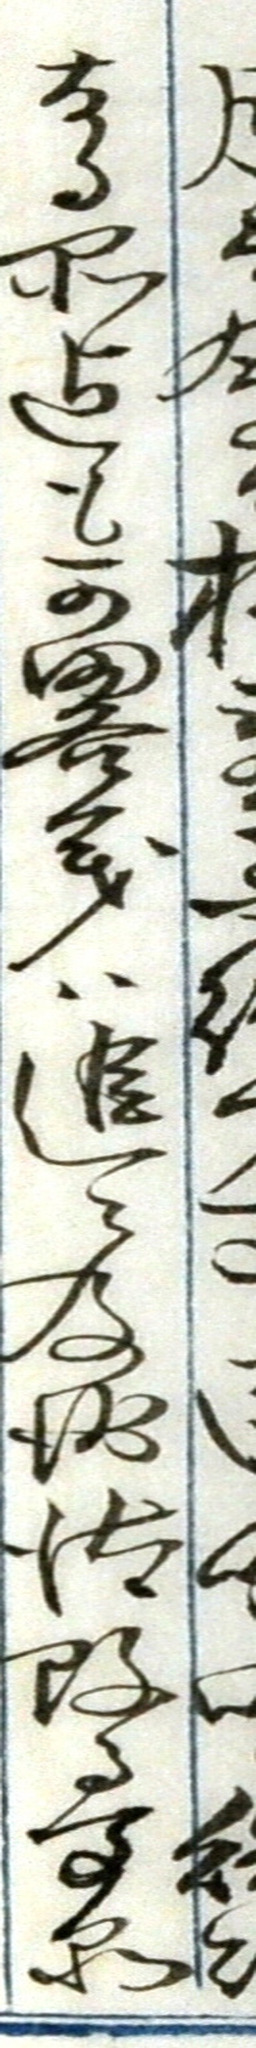なる品迄も可略義ハ追々及沙汰改る可品

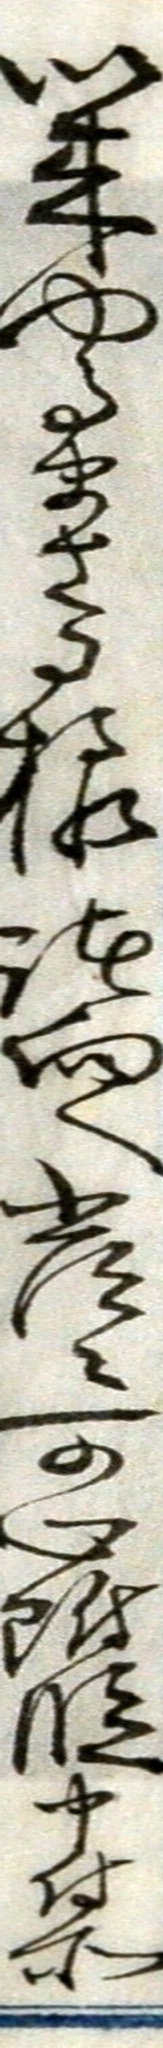以来ゆるまさる様諸向へ常々可心附段申付所
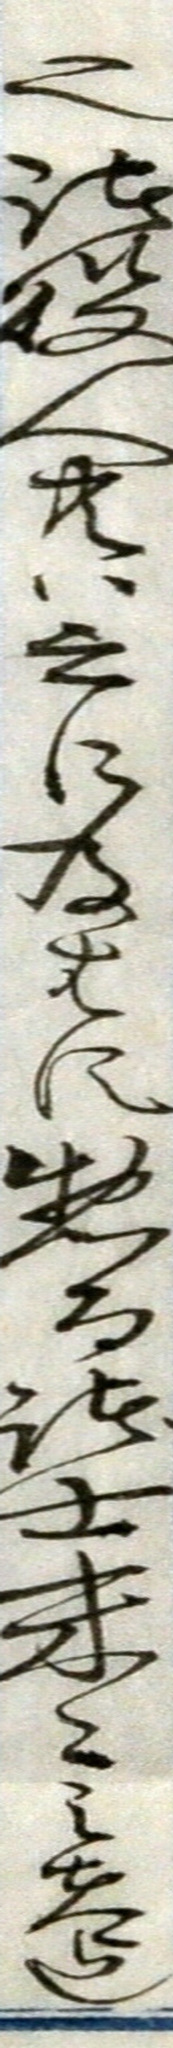也御役人共ハ云に及はす惣而諸士末々之者迄
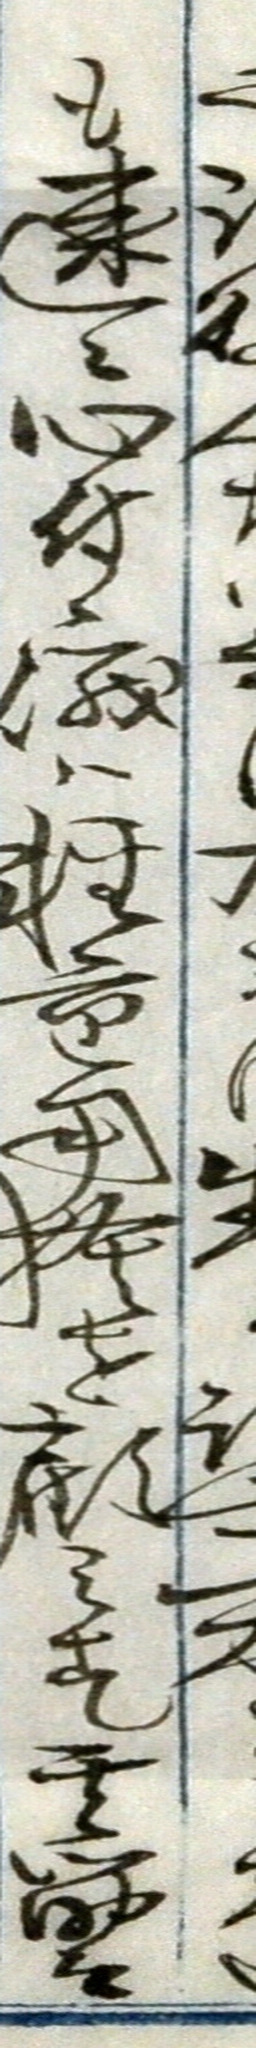も速ニ心付候儀ハ軽重用捨を顧みす其筋々
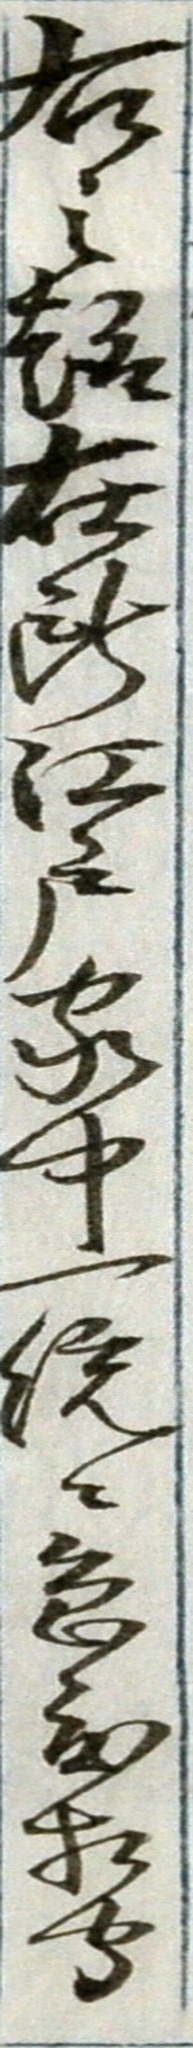右之趣在所江戸家中一統ニ急度相守
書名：頼由公御定書
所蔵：伊那市立高遠町図書館・合同会社AMANE
